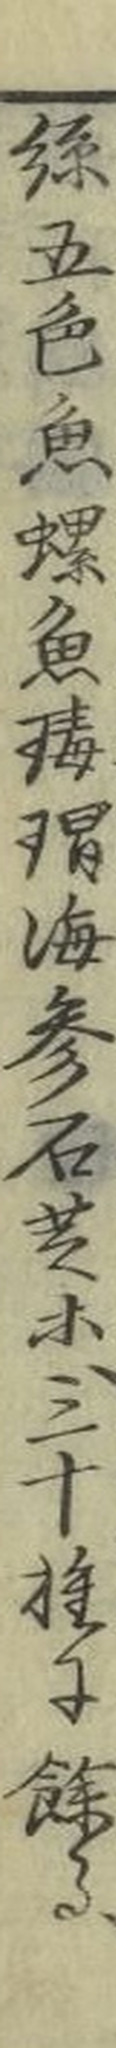絲、五色魚、螺魚、瑇瑁、海参、石芝等、三十種に余る、

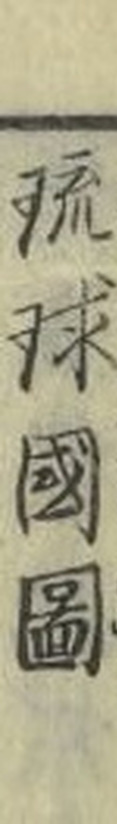琉球国図

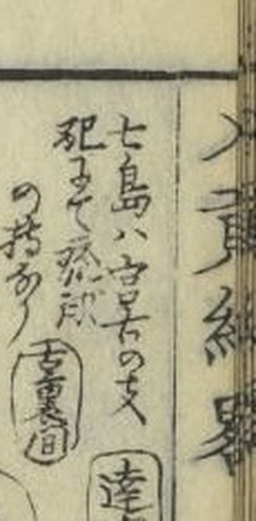七島は宮古の支
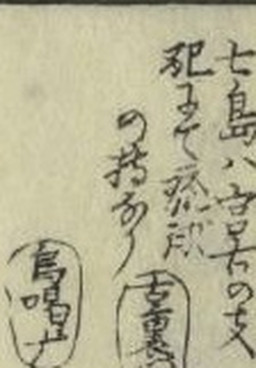の持なり
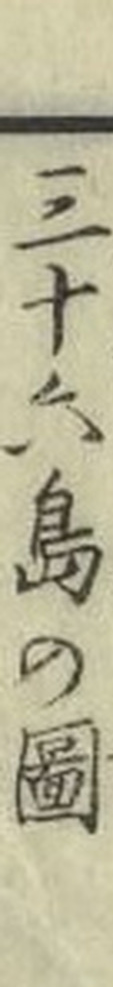三十六島の図
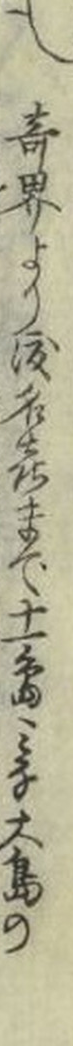奇界より渡名喜まで十一島みな大島の
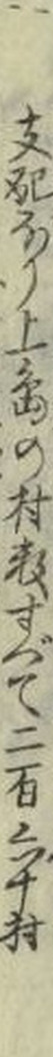支配なり上島の村数すべて二百六十村
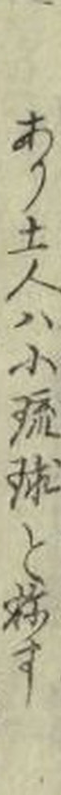あり土人は小琉球と称す
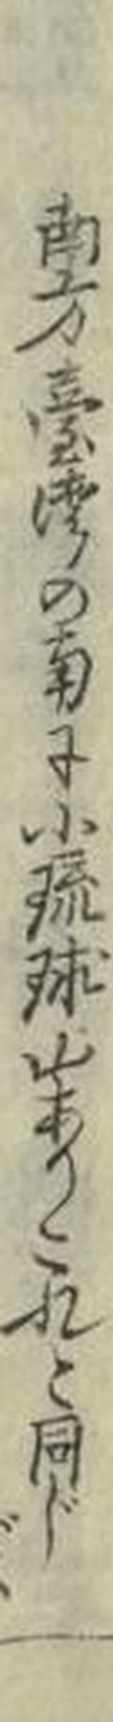南方台陸の南に小琉球山ありこれと同じ
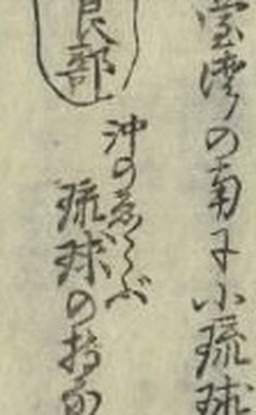沖のゑらぶ
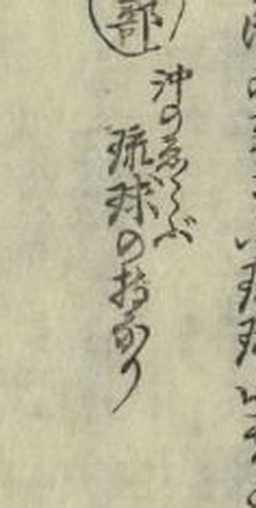琉球の持なり
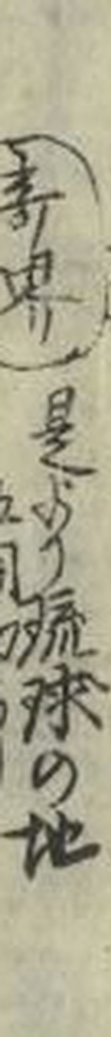是より琉球の地
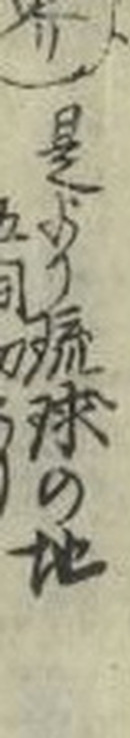是より琉球の地
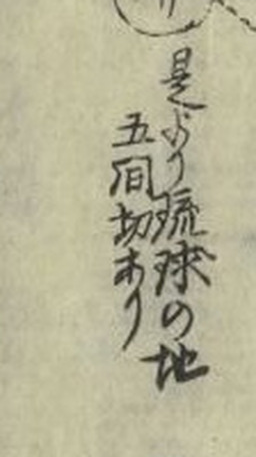五間切あり
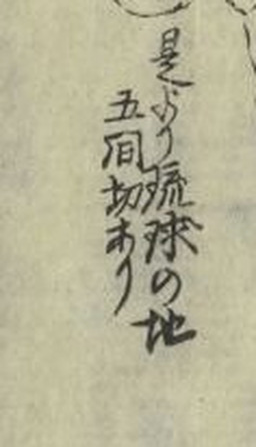五間切あり

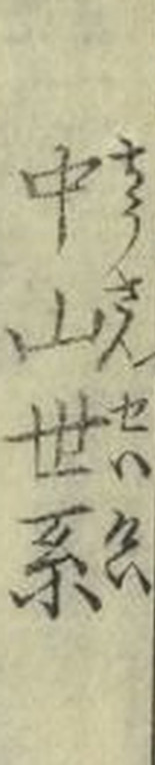中山世系
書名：琉球入貢紀略
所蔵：University of the Ryukyus Library
